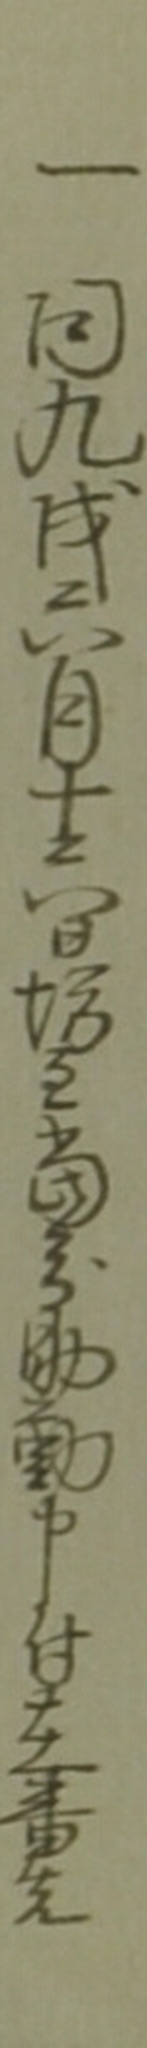一同九戌六月十六日坊主当分助勤申付在番先
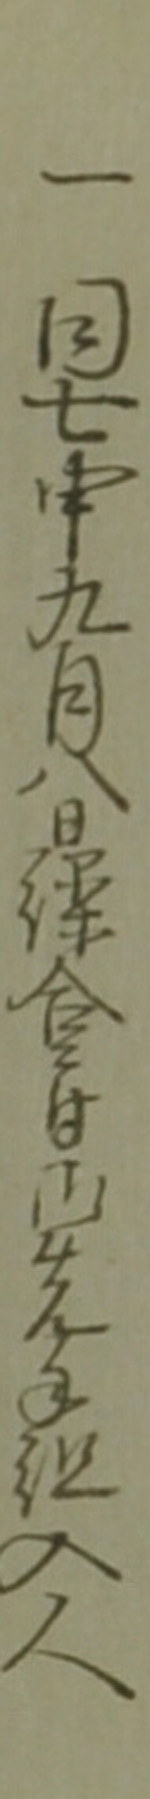一同七申九月八日繰合ニ付御先手組入人
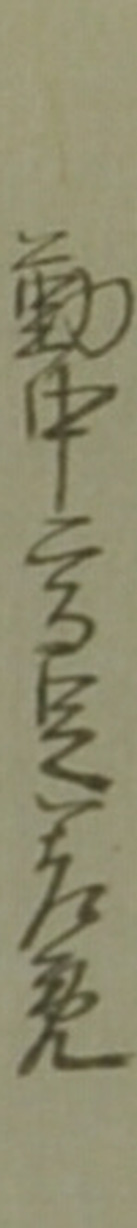勤中高足差免
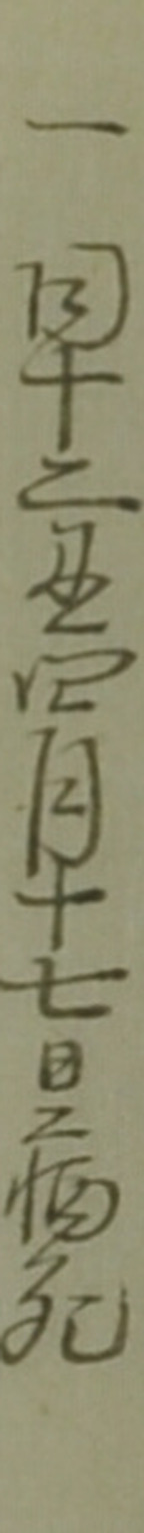一同十二丑四月十七日病死

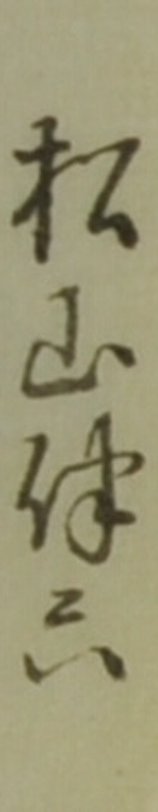松山伴六
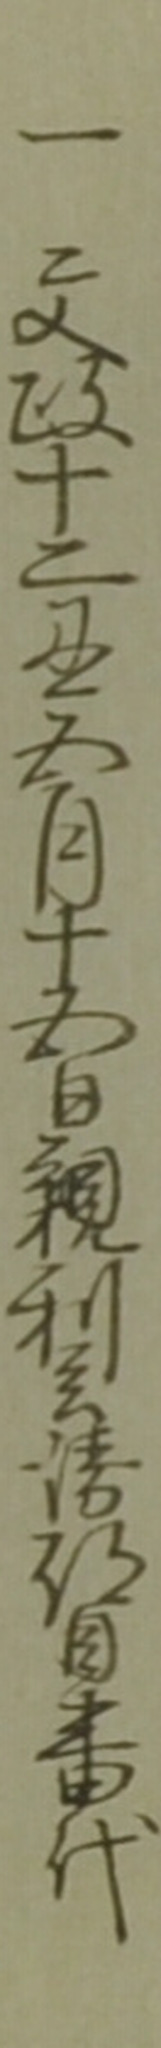一文政十二丑五月十五日親利兵衛跡目番代
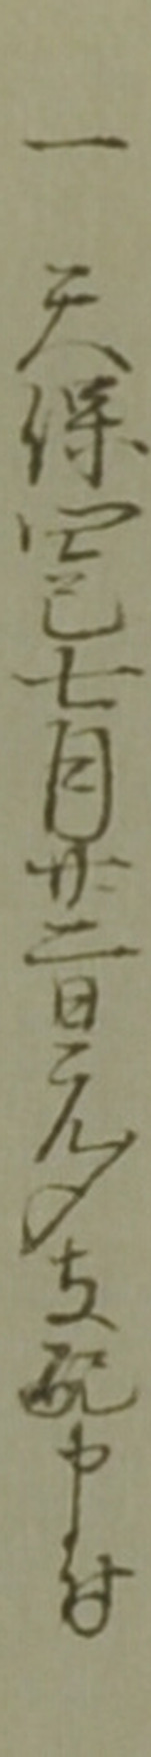一天保四巳七月廿二日元〆支配申付
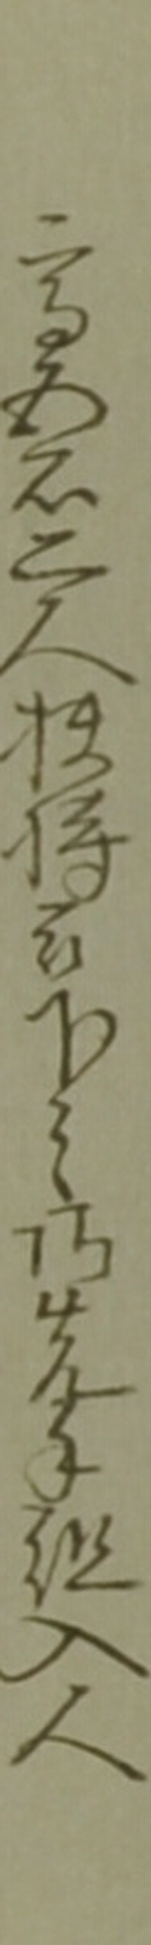高五石二人扶持被下之御先手組入人
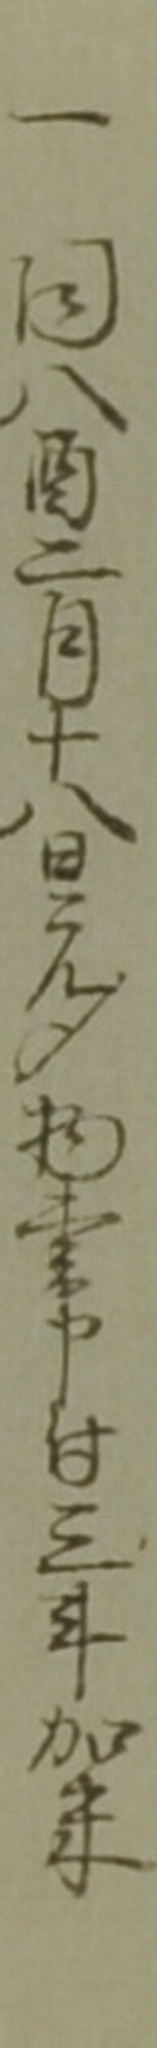一同八酉二月十八日元〆物書申付三斗加米
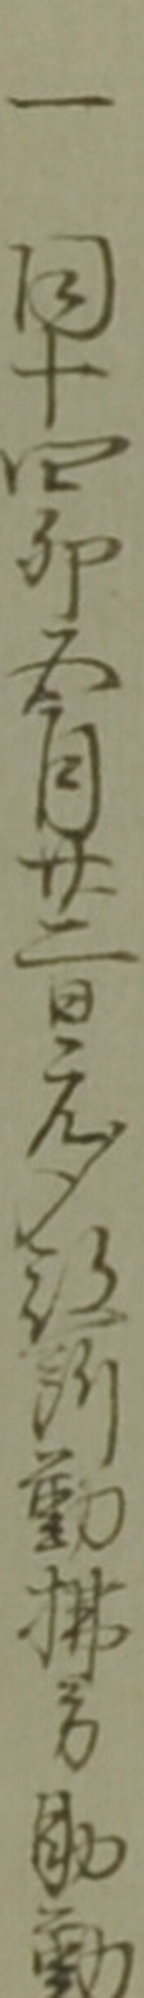一同十四卯五月廿二日元〆役所勤払方助勤
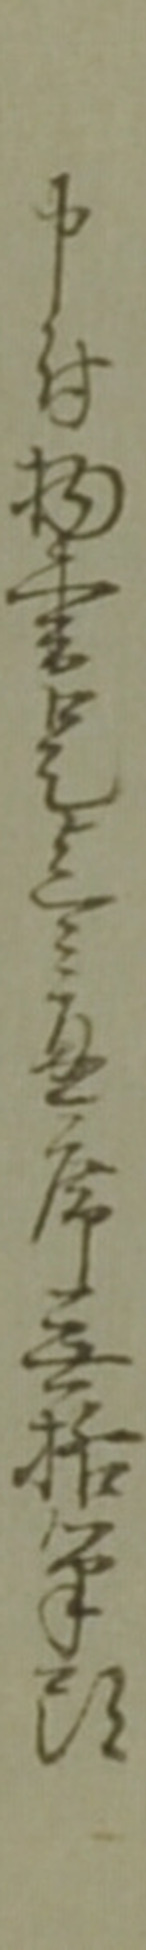申付物書是迄之通席無格筆頭
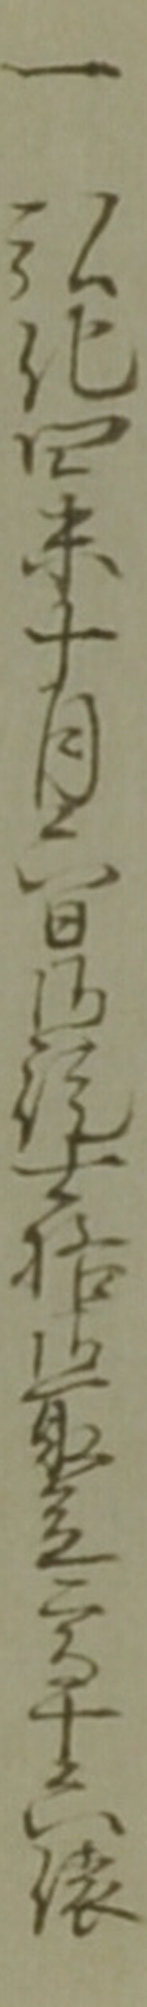一弘化四未十月六日御徒士格御取立高十六俵
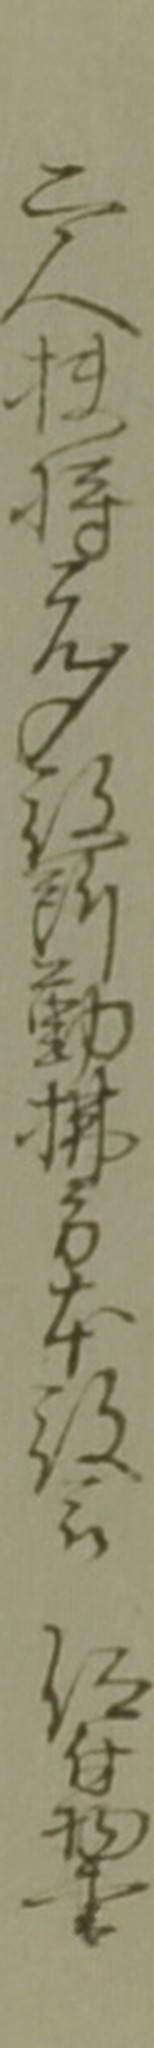二人扶持元〆役所勤払方本役被仰付物書

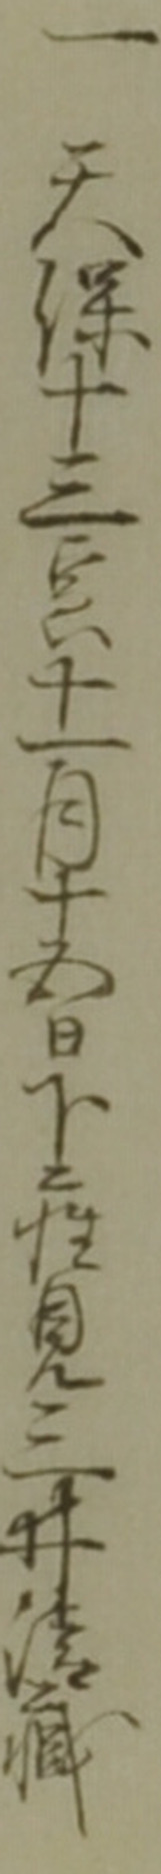一天保十三寅十一月十五日下座見三井清蔵
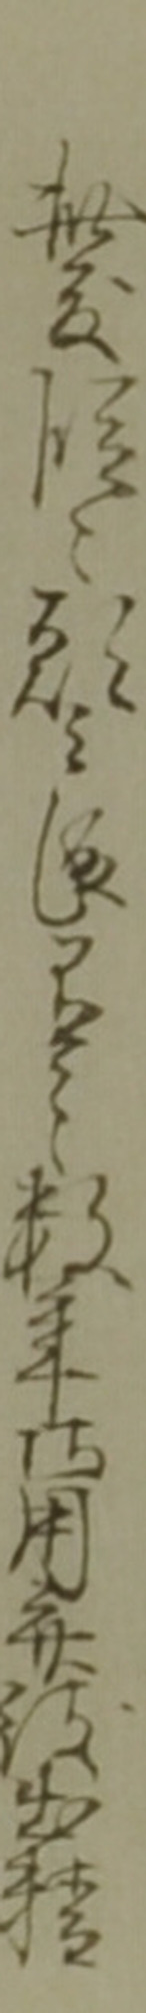此度段々願之趣有之数年御用弁致出精
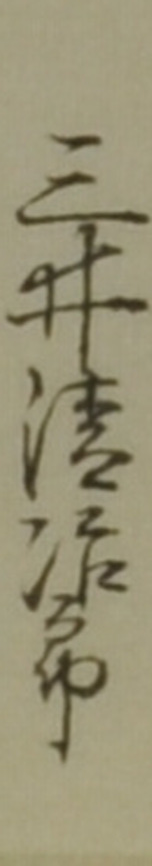三井清治郎
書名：無足諸士勤仕録（七）
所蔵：伊那市立高遠町図書館・合同会社AMANE
